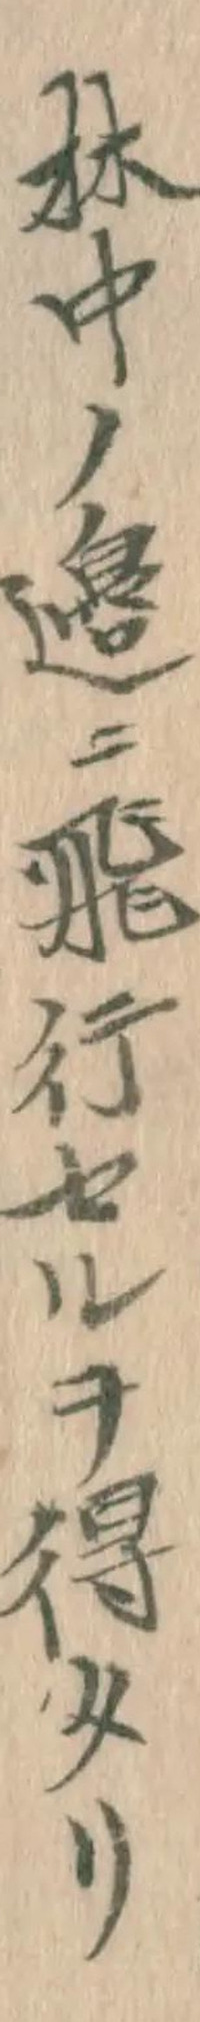キ林中ノ邉ニ飛行セルヲ得タリ
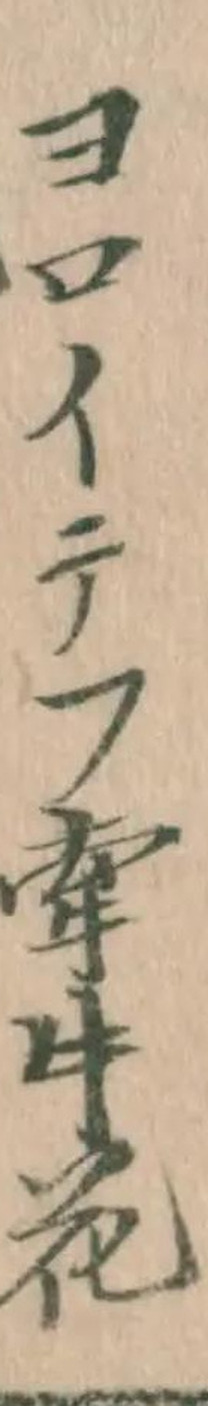ヨロイテフ牽牛花
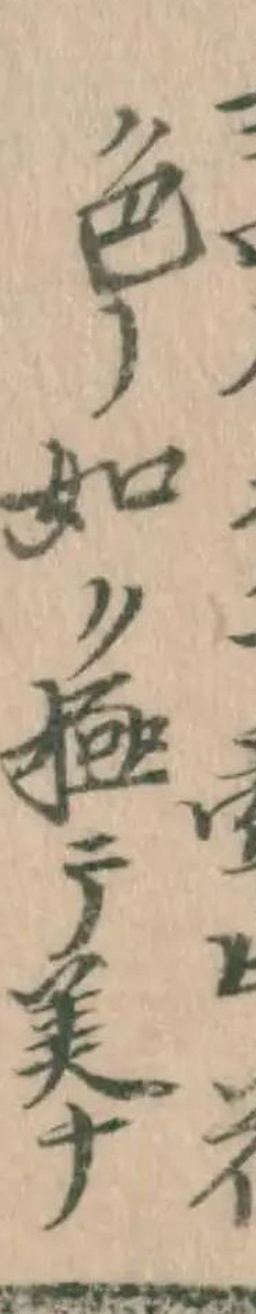色ノ如ク極テ美ナ
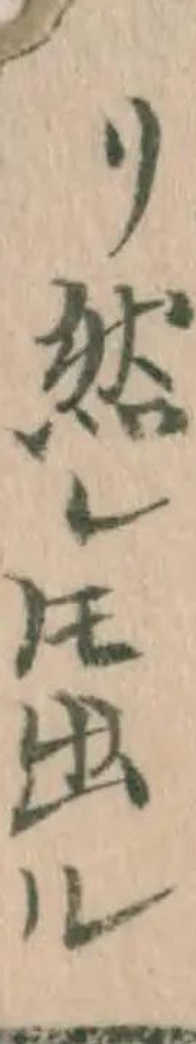リ然レトモ出ル
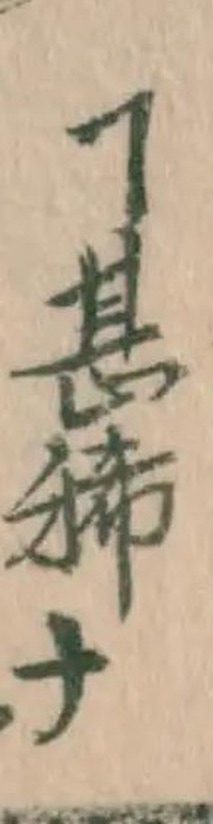コト甚稀ナ
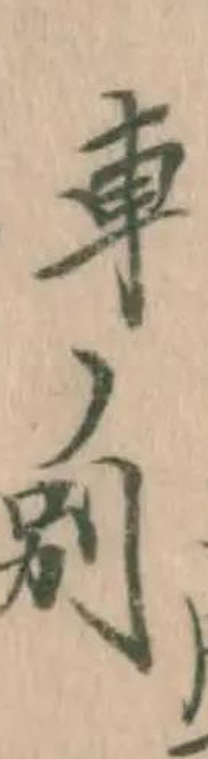車ノ別
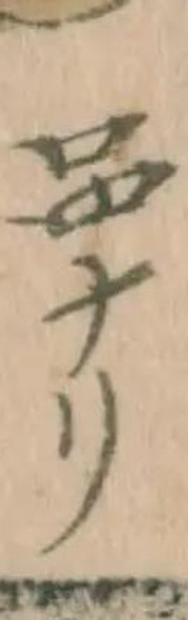品ナリ
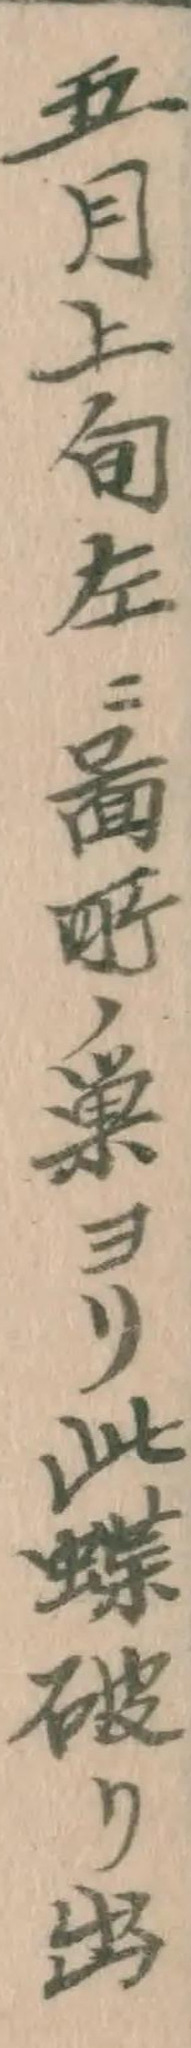五月上旬左ニ啚所ノ巣ヨリ此蝶破リ出
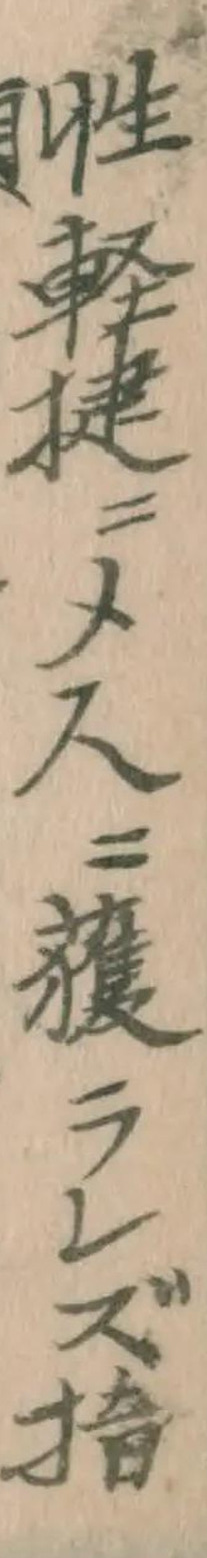性軽捷ニシテ人ニ獲ラレズ指
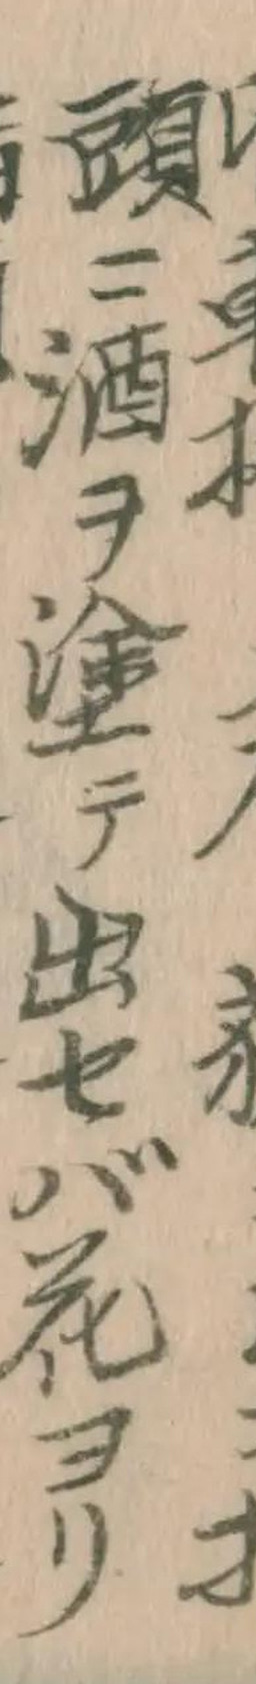頭ニ酒ヲ塗テ出セバ花ヨリ
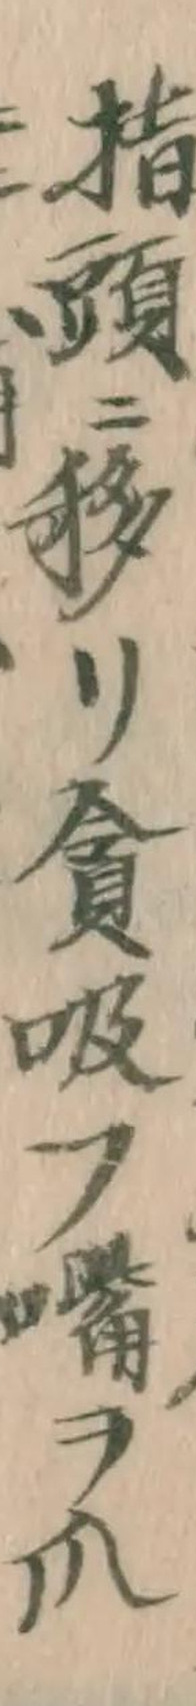指頭ニ移リ貪吸フ嘴ヲ爪
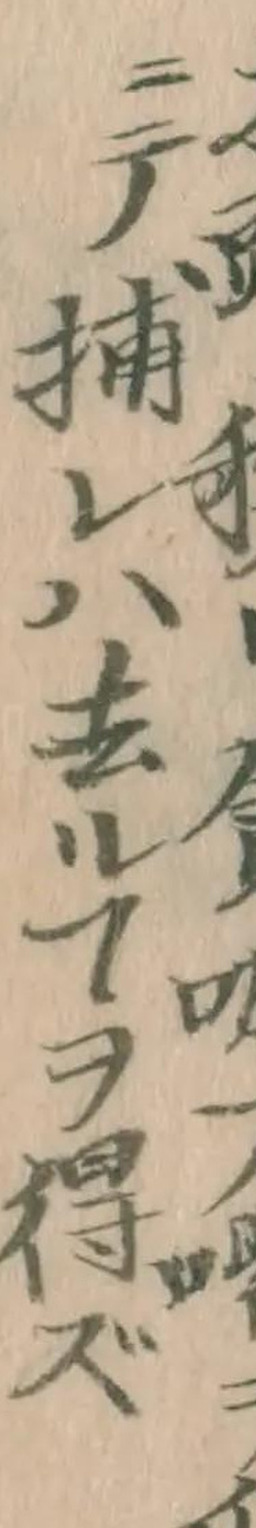ニテ捕レハ去ルコトヲ得ズ
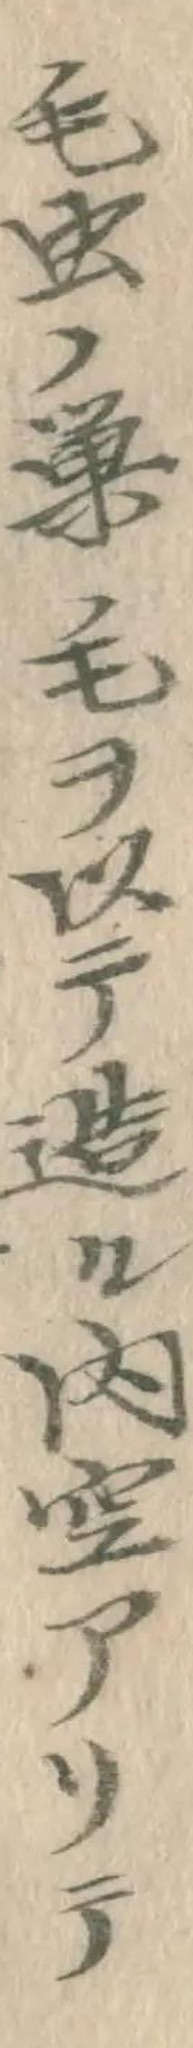毛虫ノ巣毛ヲ以テ造ル内空アリテ
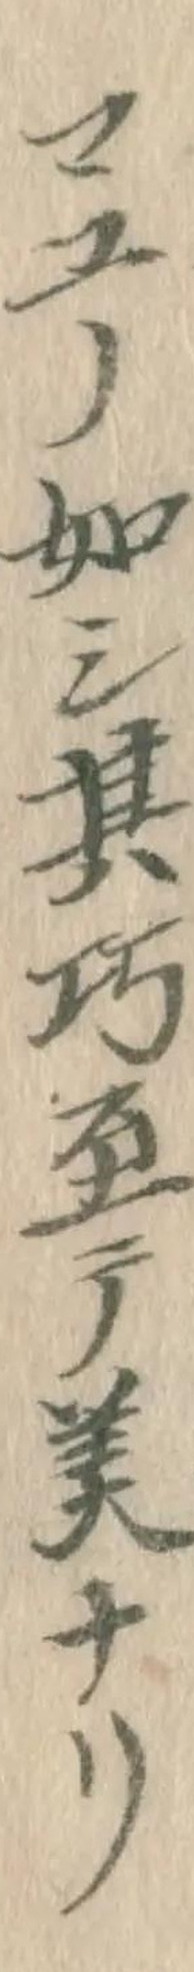マユノ如シ其巧至テ美ナリ

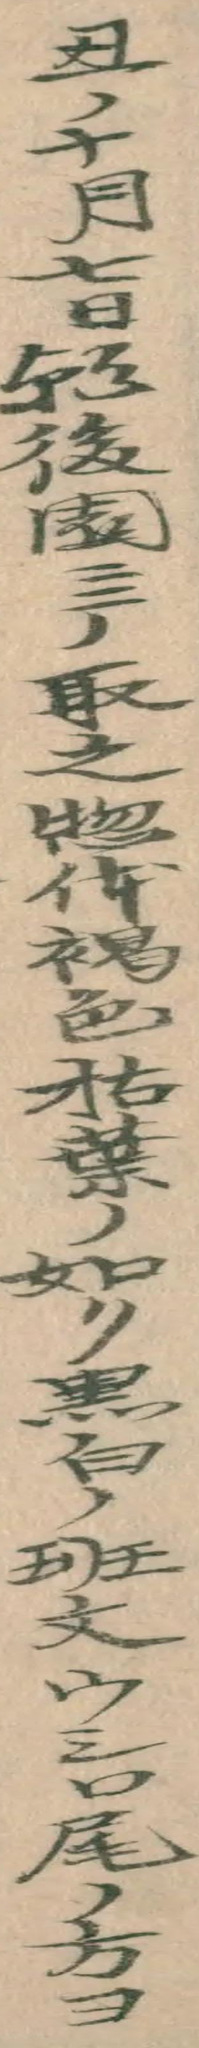丑ノ十月七日朝後園ニテ取之惣体褐色枯葉ノ如ク黒白ノ班文ウシロ尾ノ方ヨ
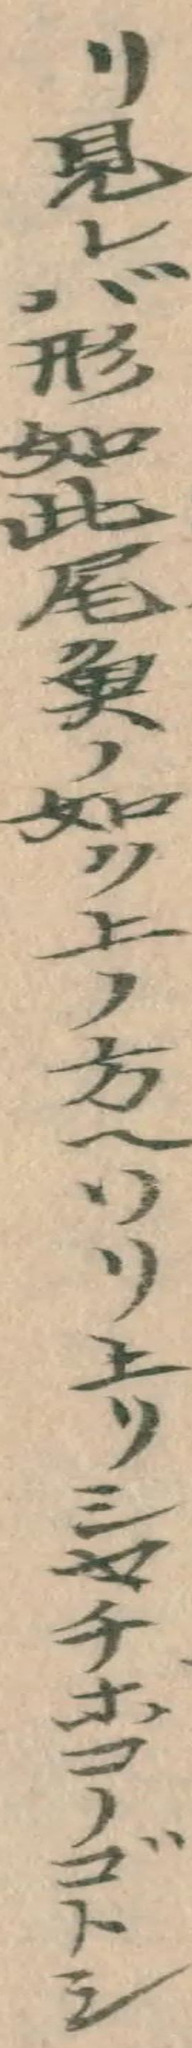リ見レバ形如此尾魚ノ如ク上ノ方ヘソリ上リシヤチホコノゴトシ
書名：千蟲譜 3巻. [1]
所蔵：国立国会図書館 National Diet Library, JAPAN
